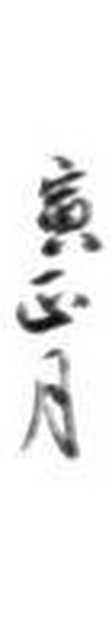寅正月

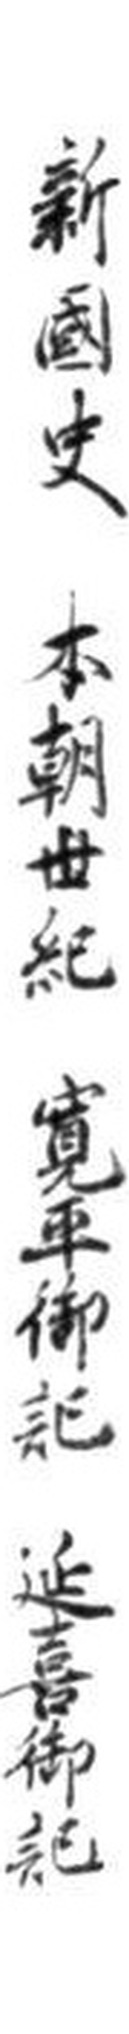新国史本朝世紀寛平御記延喜御記
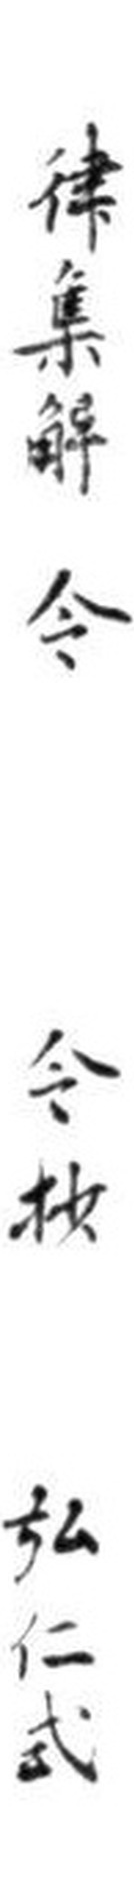律集解令令抄弘仁式
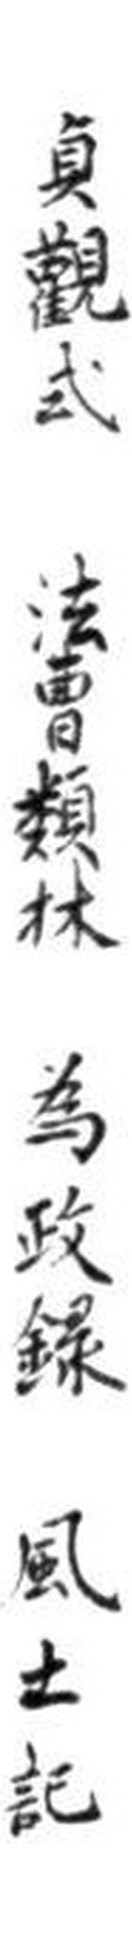貞観式法曹類林為政録風土記
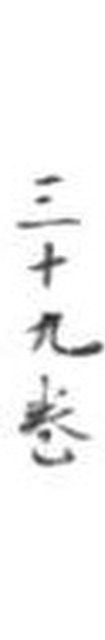三十九巻
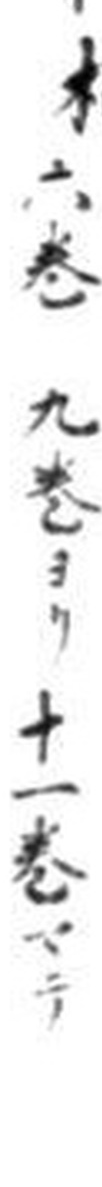六巻九巻ヨリ十一巻マテ
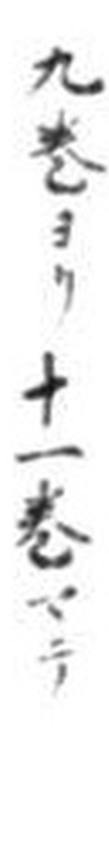八巻ヨリ十二巻マテ
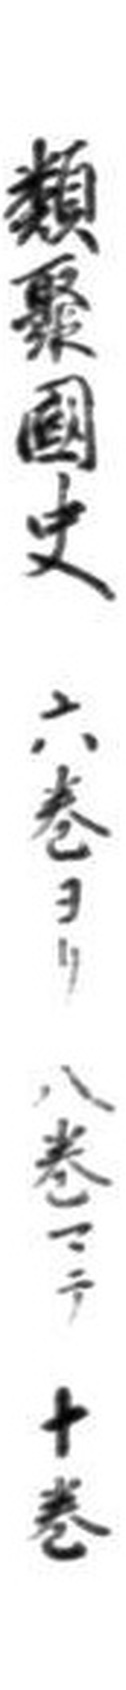類聚国史六巻ヨリ八巻マテ十巻
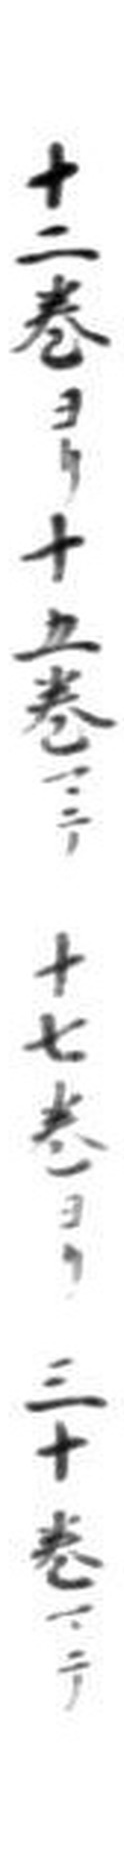十二巻ヨリ十五巻マテ十七巻ヨリ三十巻マテ
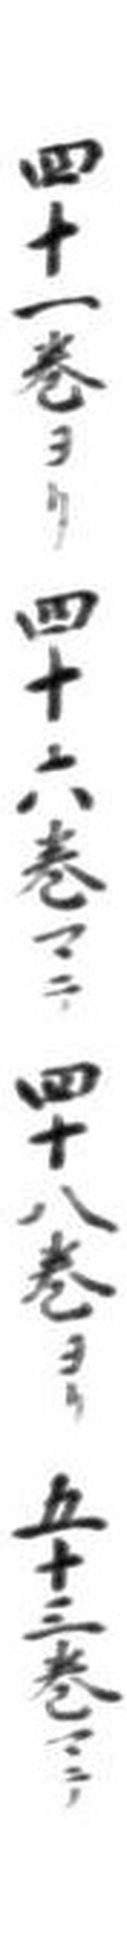四十一巻ヨリ四十六巻マテ四十八巻ヨリ五十三巻マテ
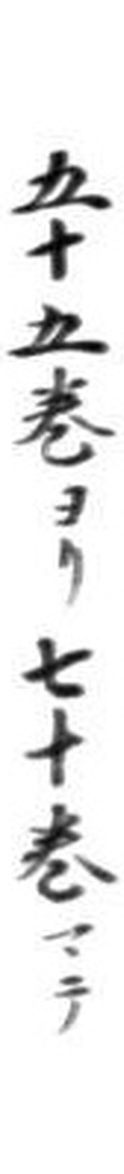五十五巻ヨリ七十巻マテ
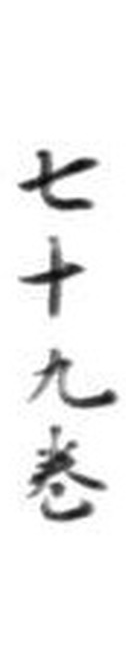七十九巻
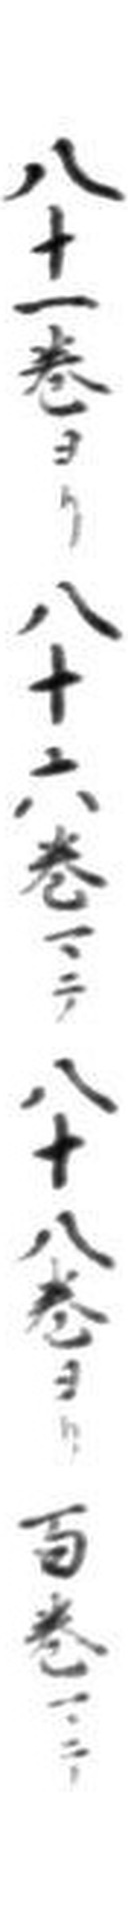八十一巻ヨリ八十六巻マテ八十八巻ヨリ百巻マテ
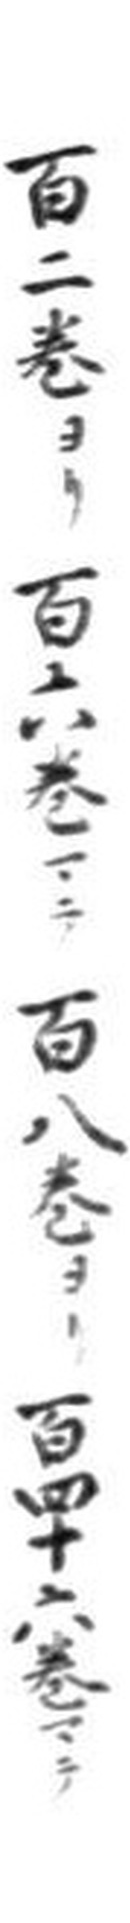百二巻ヨリ百六巻マテ百八巻ヨリ百四十六巻マテ

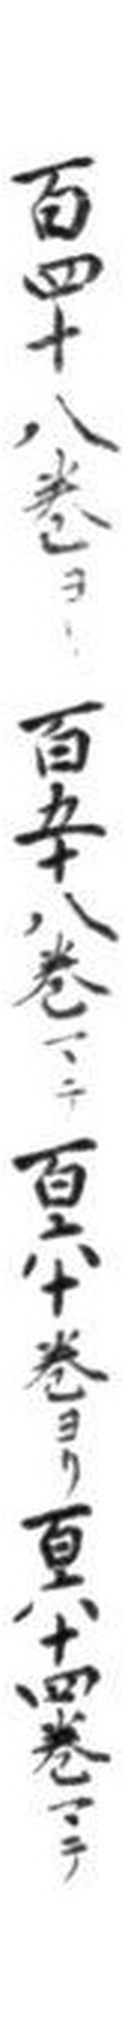百四十八巻ヨリ百五十八巻マテ百六十巻ヨリ百六十四巻マテ
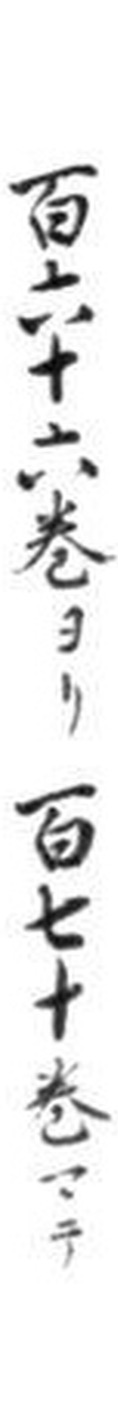百六十六巻ヨリ百七十巻マテ
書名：家譜 三十五 宗昌公 従享保六年到同七年
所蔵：福井県文書館 Fukui Prefectural Archives
